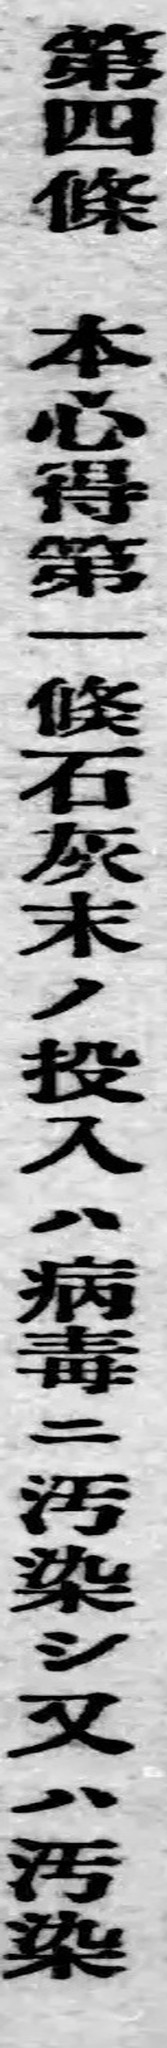第四條本心得第一條石灰末ノ投入ハ病毒ニ汚染シ又ハ汚染
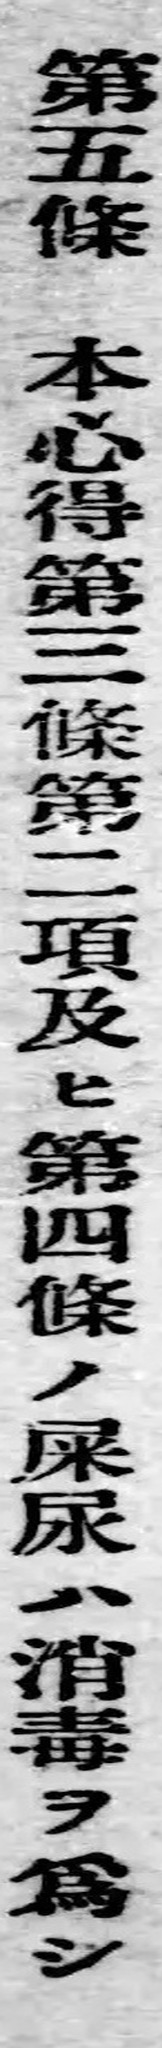第五條本心得第三條第二項及ヒ第四條ノ屎尿ハ消毒ヲ為シ
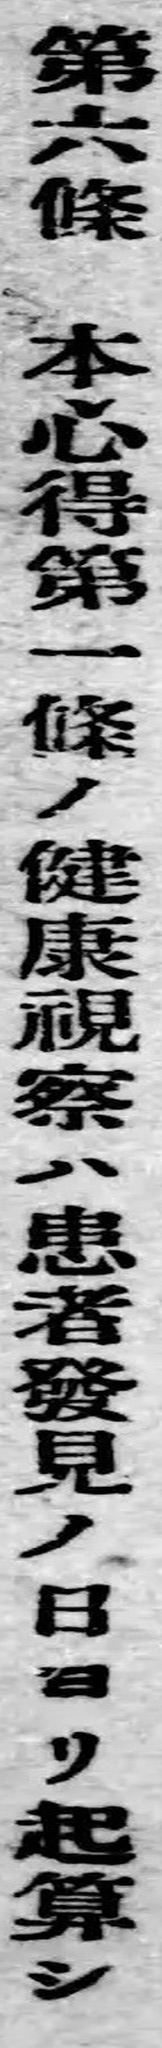第六條本心得第一條ノ健康視察ハ患者發見ノ日ヨリ起算シ
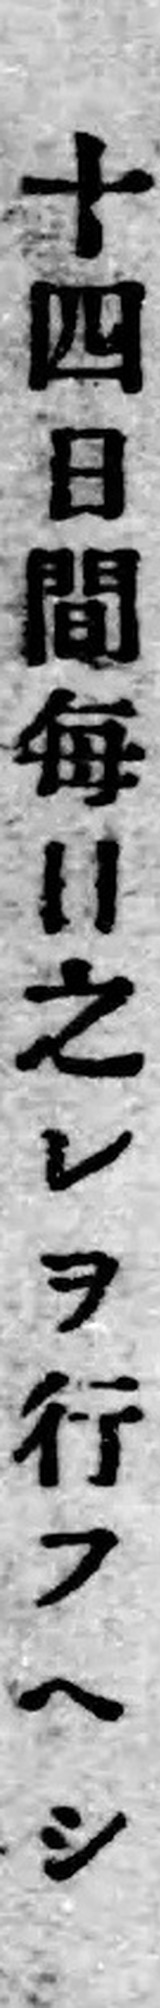十四日間毎日之レヲ行フヘシ
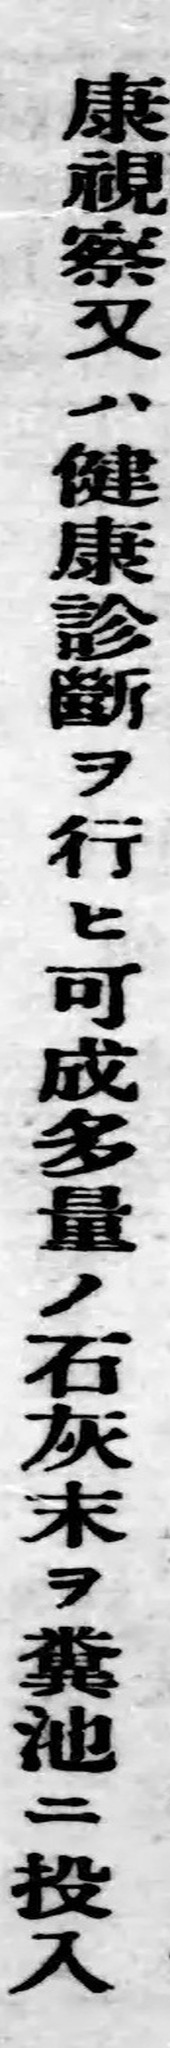康視察又ハ健康診斷ヲ行ヒ可成多量ノ石灰末ヲ糞池ニ投入
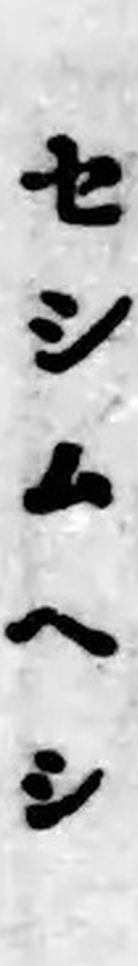セシムヘシ
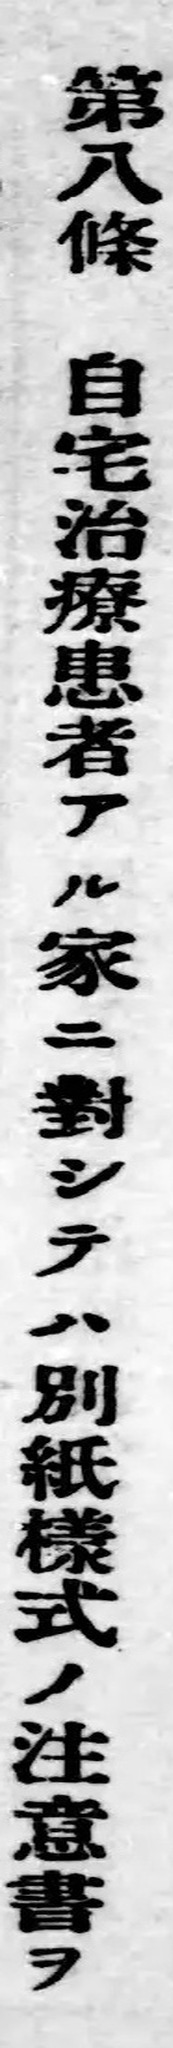第八條自宅治療患者アル家ニ對シテハ別紙様式ノ注意書ヲ
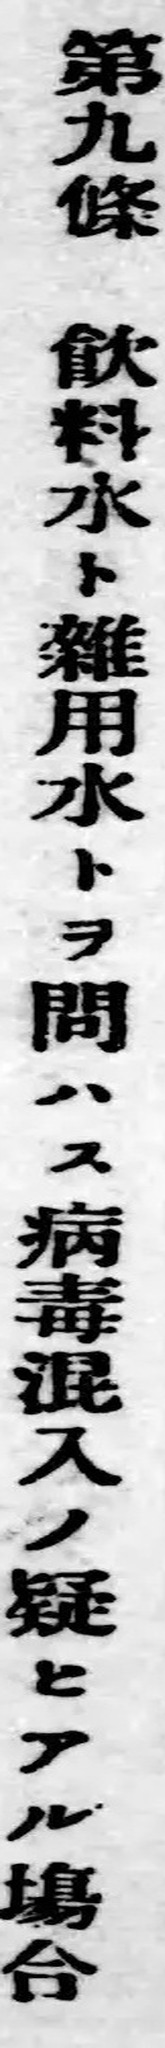第九條飮料水ト雜用水トヲ間ハス病毒混入ノ疑ヒアル塲合
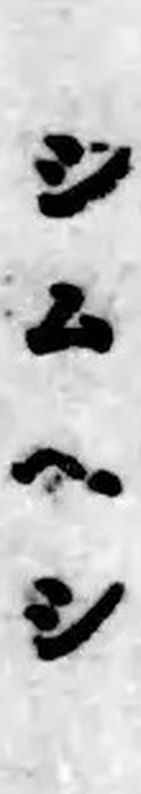シムヘシ
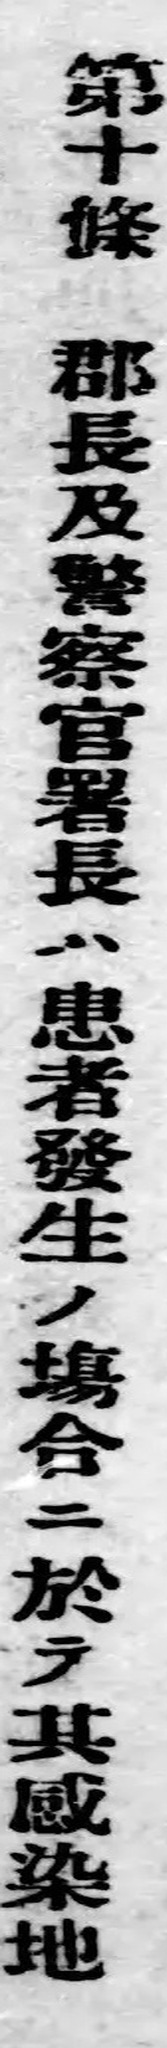第十條郡長及警察官署長ハ患者發生ノ塲合ニ於テ其感染地
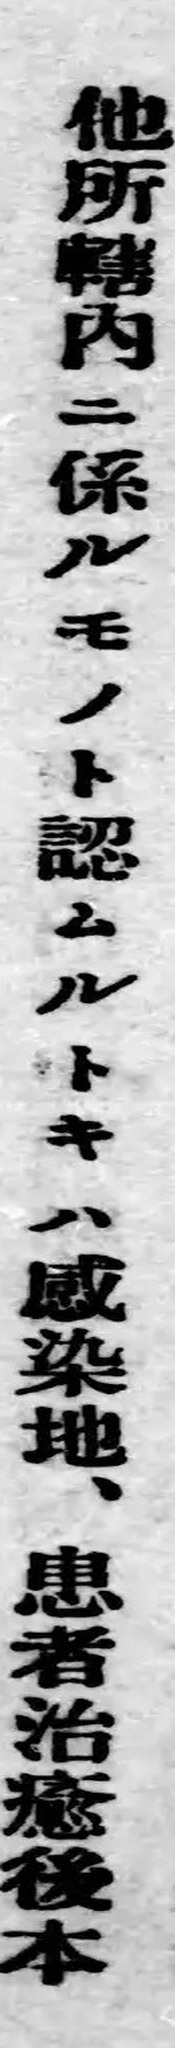他所轄内ニ係ルモノト認ムルトキハ感染地、患者治癒後本

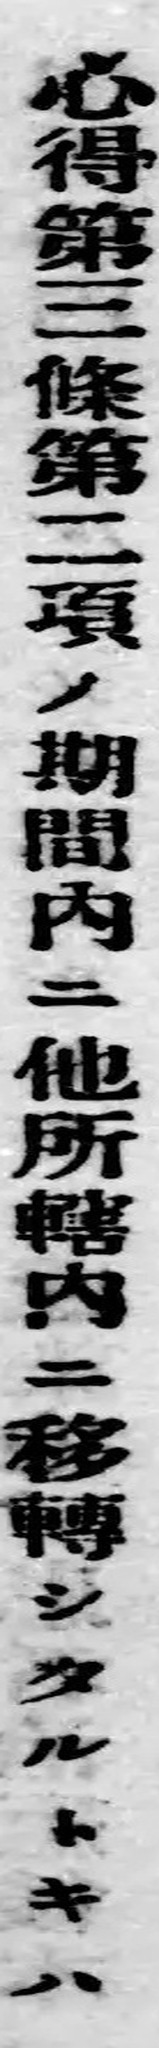心得第三條第二項ノ期間内ニ他所轄内ニ移轉シタルトキハ
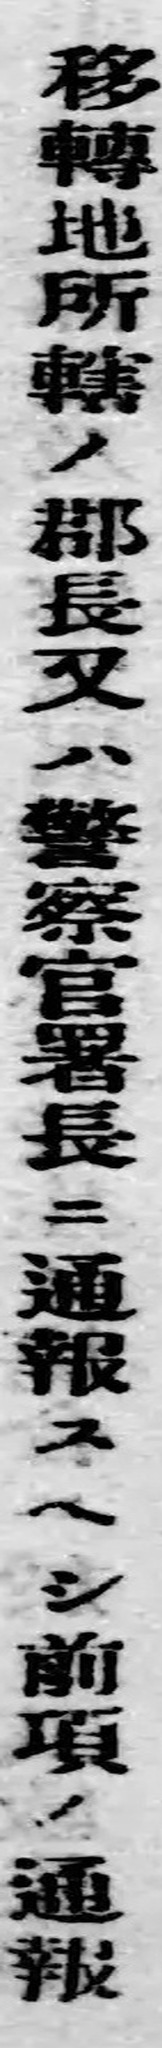移轉地所轄ノ郡長又ハ警察官署長ニ通報スヘシ前項ノ通報
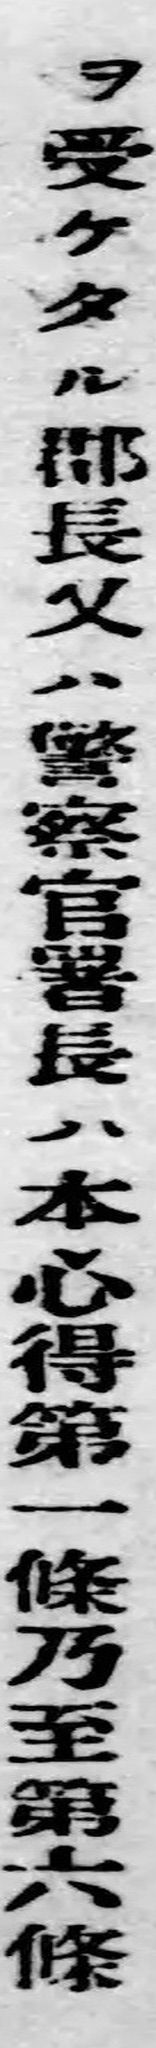ヲ受ケタル郡長又ハ警察官署長ハ本心得第一條乃至第六條
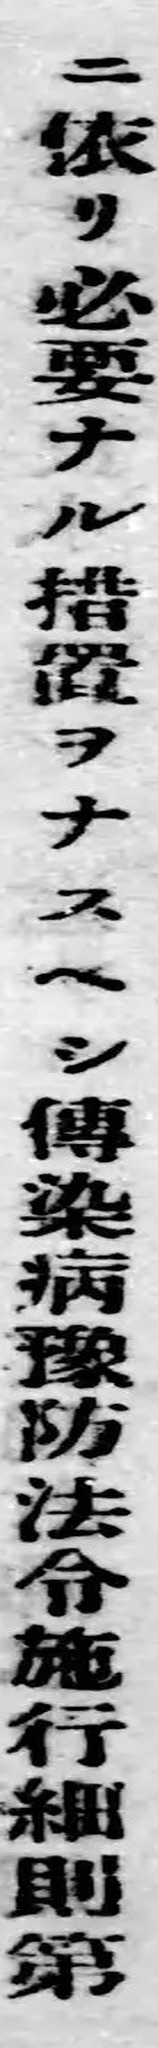ニ依リ必要ナル措置ヲナスヘシ傅染病豫防法令施行細則第
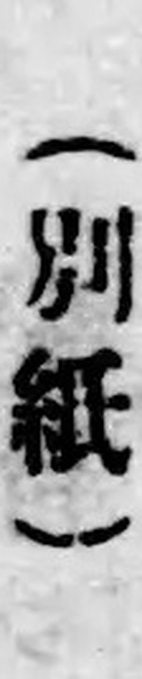(別紙)
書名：袖珍防疫必携
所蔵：国立国会図書館 National Diet Library, JAPAN
